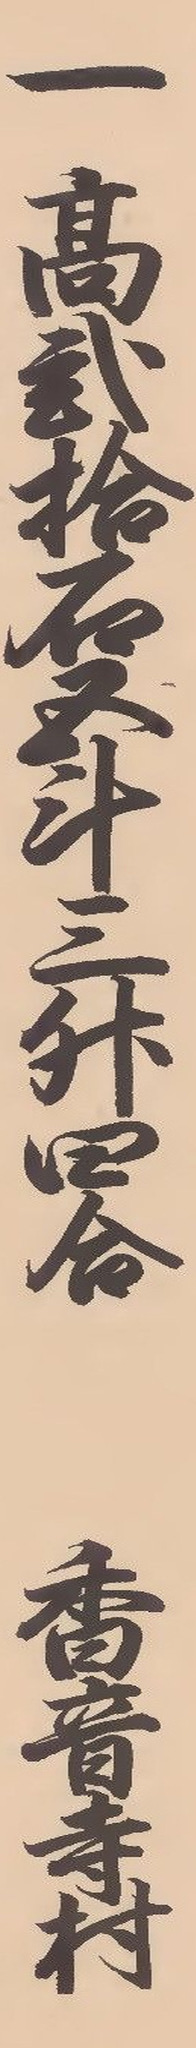一高弐拾石五斗三升四合香音寺村
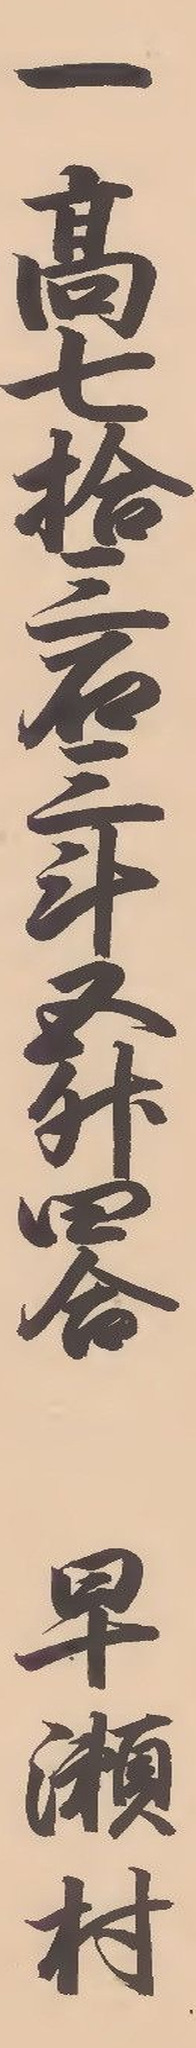一高七拾三石三斗五升四合早瀬村

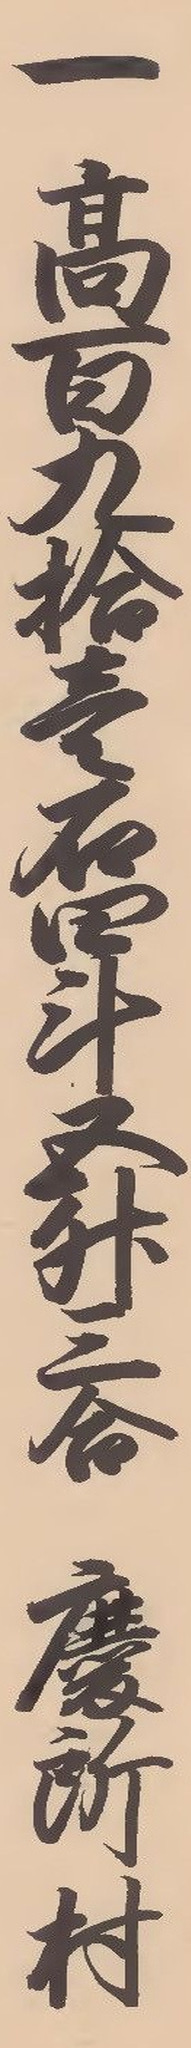一高百九拾壱石四斗五升三合慶所村
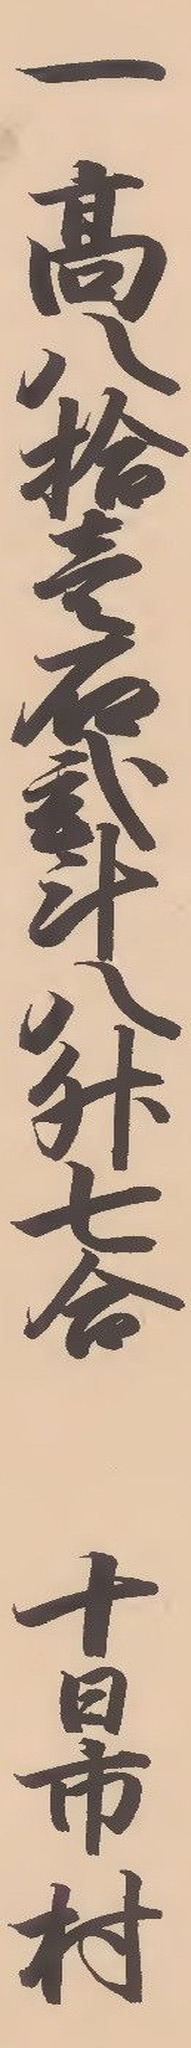一高八拾壱石弐斗八升七合十日市村
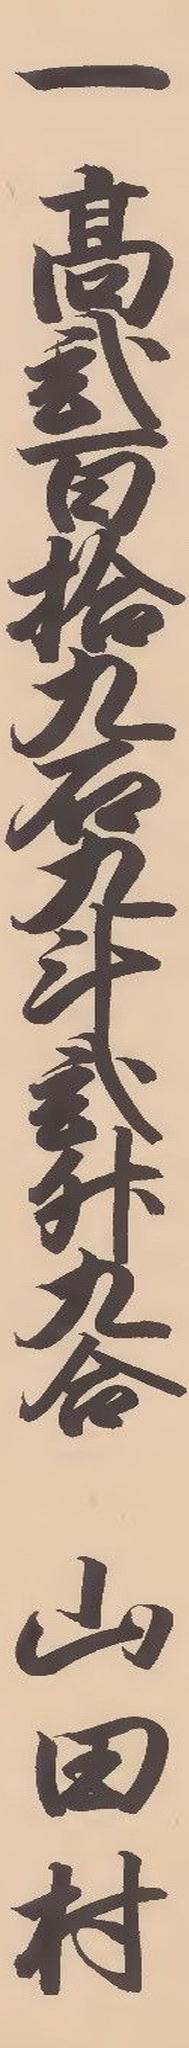一高弐百拾九石九斗弐升九合山田村
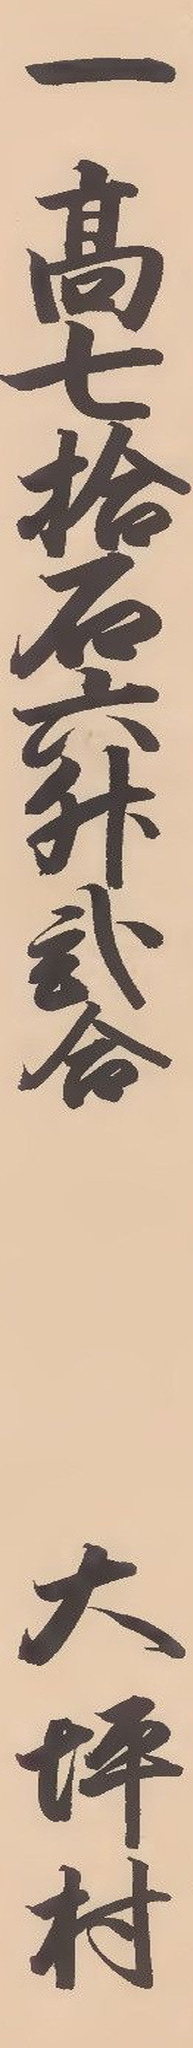一高七拾石六升弐合大坪村
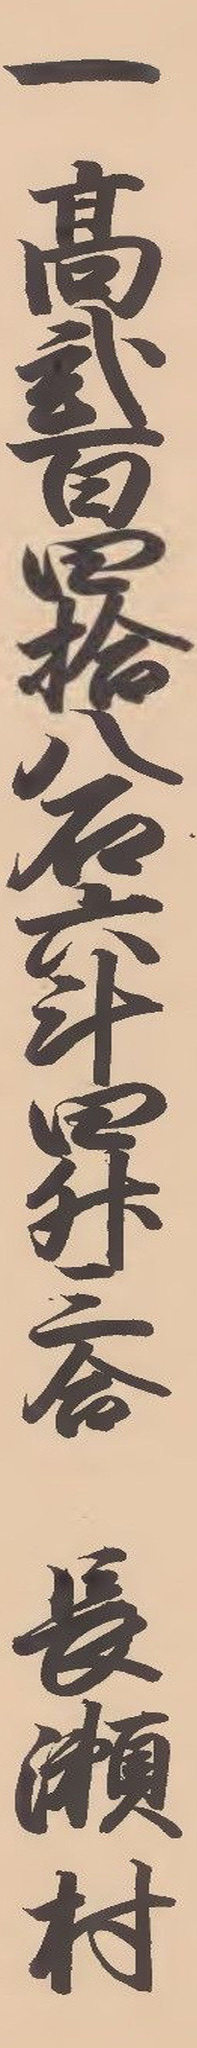一高弐百四拾八石六斗四升三合長瀬村
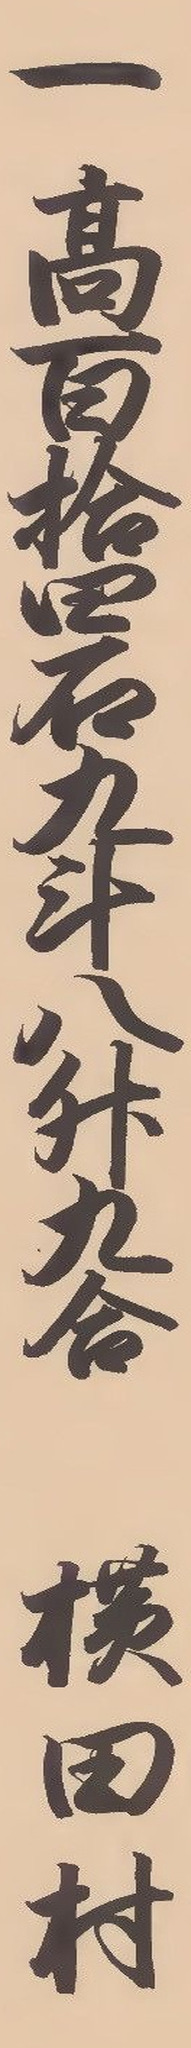一高百拾四石九斗八升九合横田村
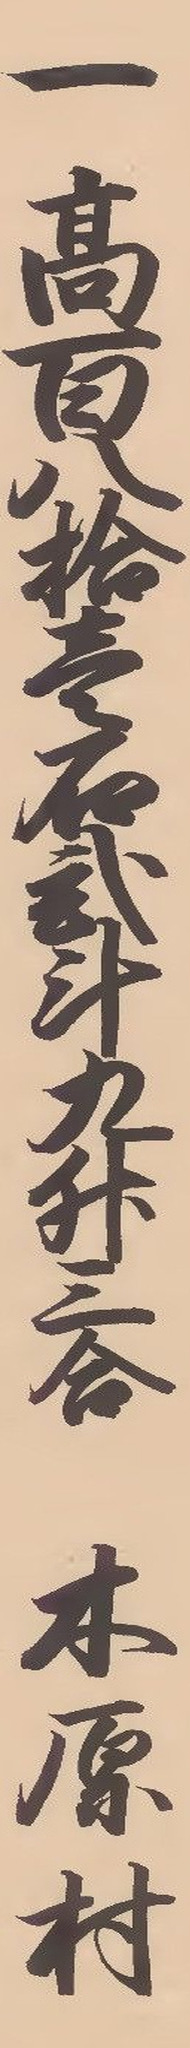一高百八拾壱石弐斗九升三合木原村

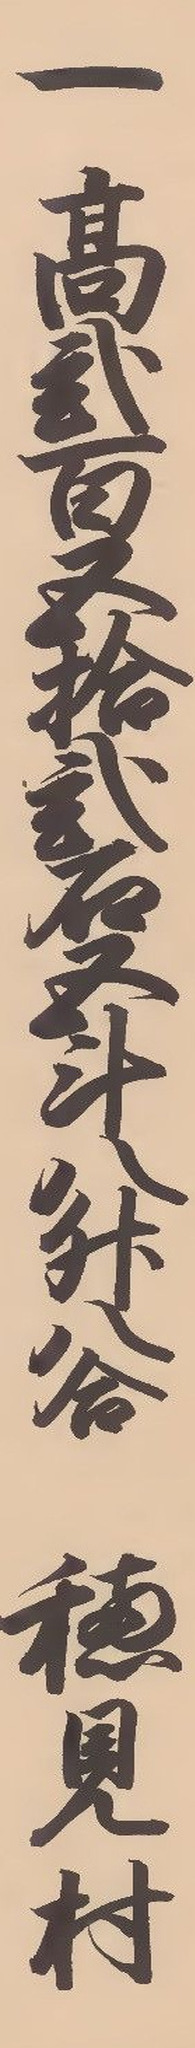一高弐百五拾弐石五斗八升八合穂見村
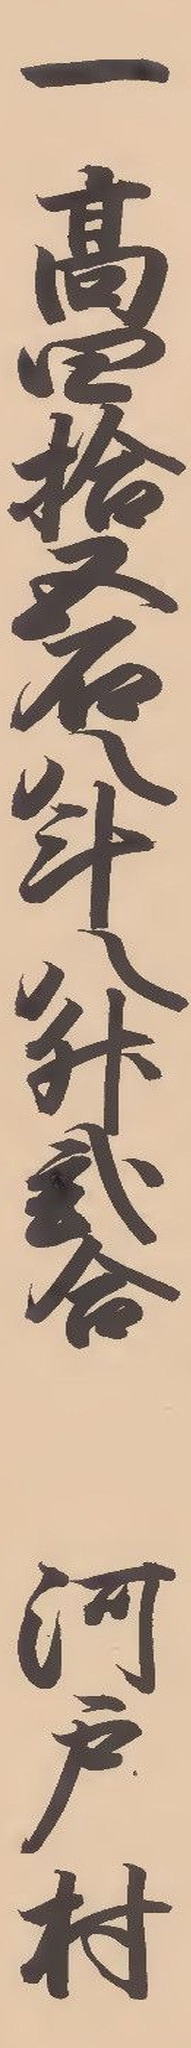一高四拾五石八斗八升弐合河戸村
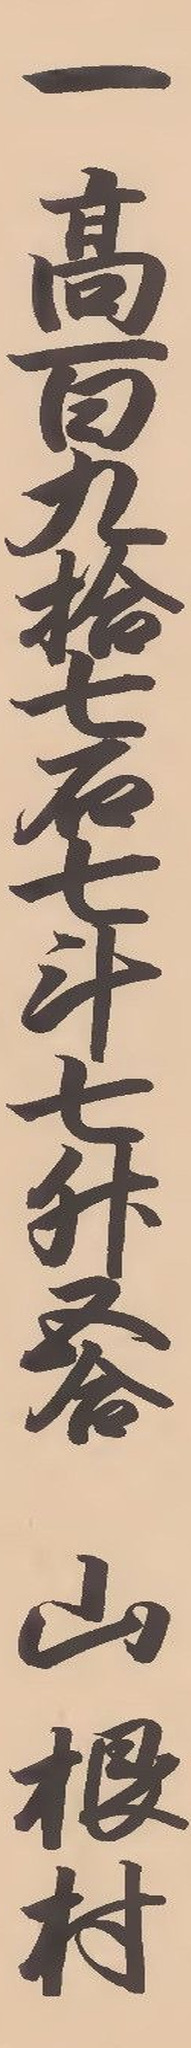一高百九拾七石七斗七升五合山根村
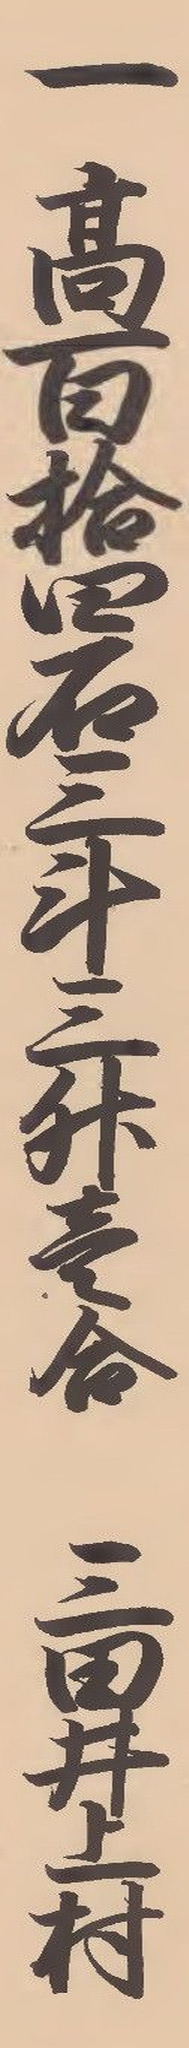一高百拾四石三斗三升壱合三田井上村
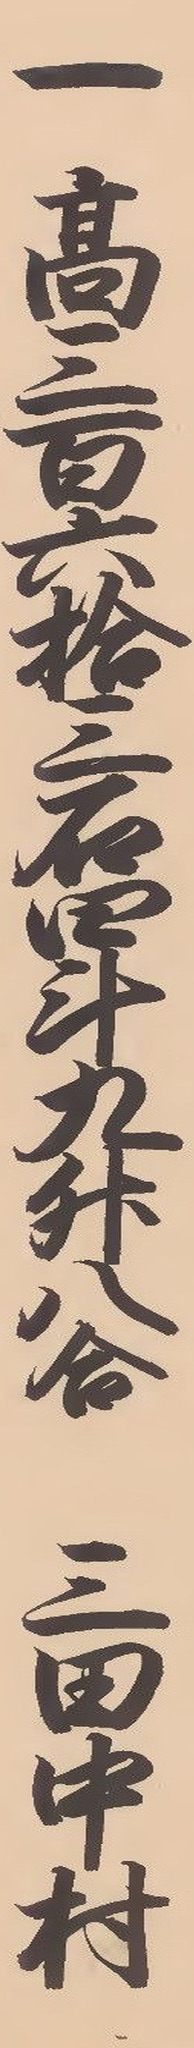一高三百六拾三石四斗九升八合三田中村
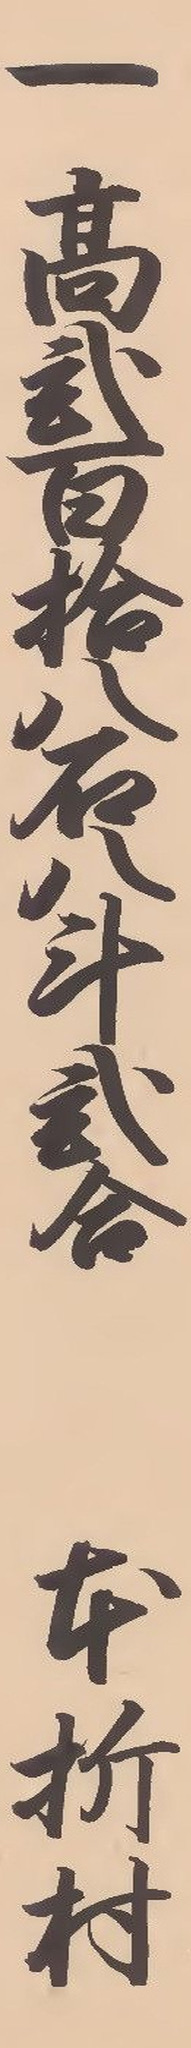一高弐百拾八石八斗弐合本折村
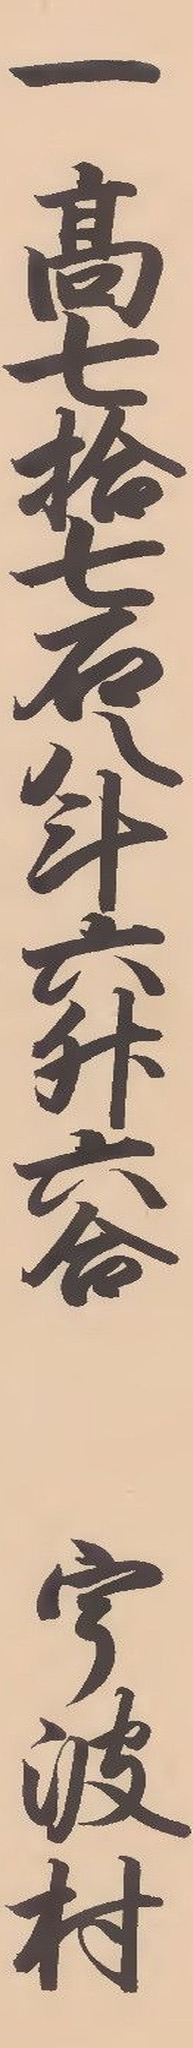一高七拾七石八斗六升六合宇波村
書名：因幡国郷帳
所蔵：国立公文書館 National Archives of Japan
